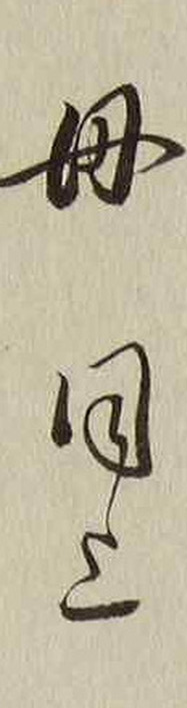母同上

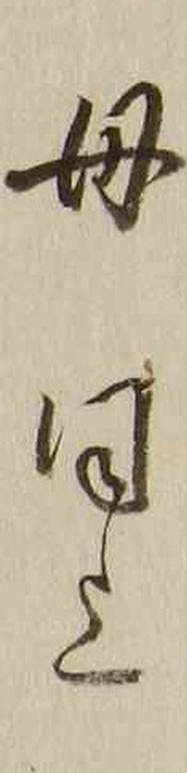母同上
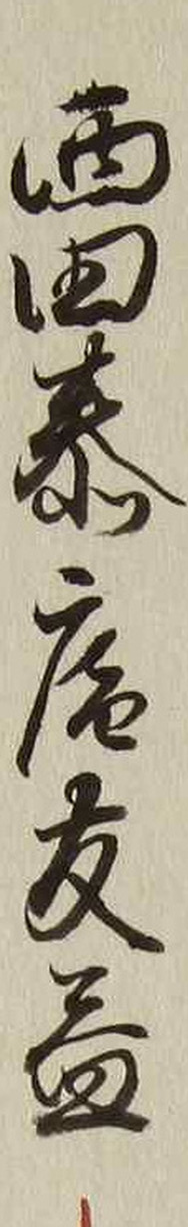西田泰庵友益
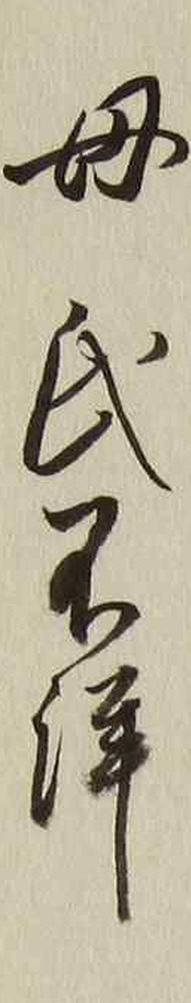母氏不詳
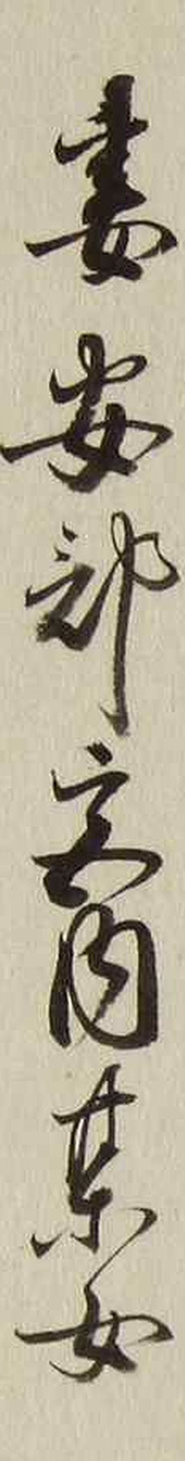妻阿部宮内某女

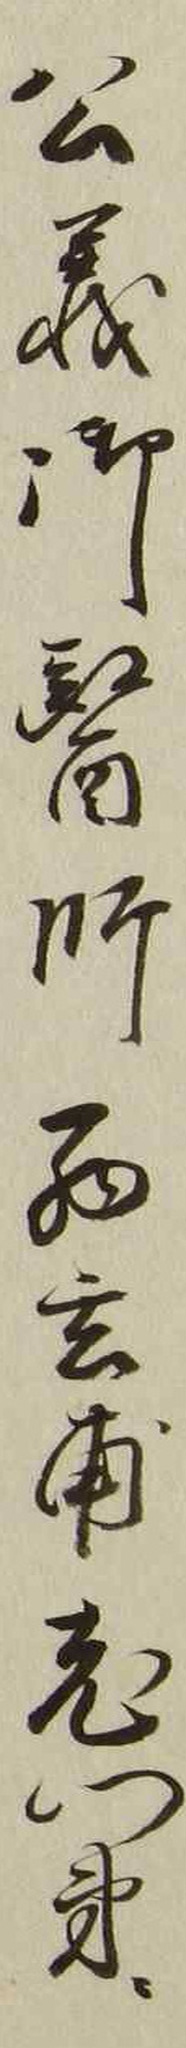公義御医師西玄甫老門弟ニ
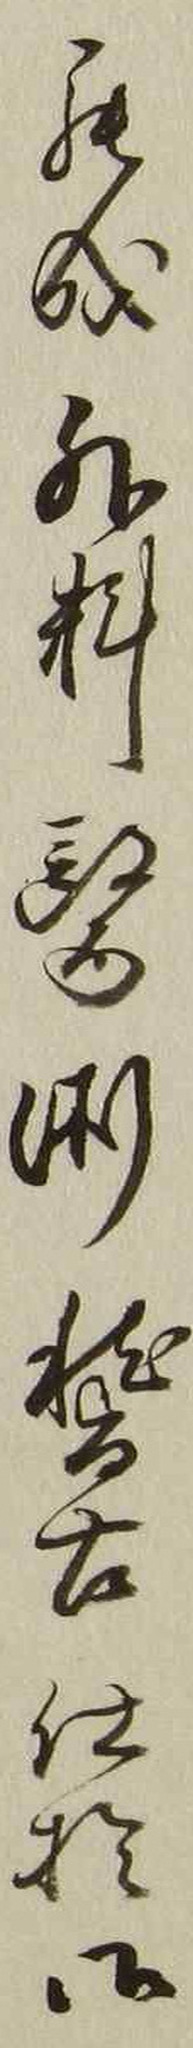罷成外料医術稽古仕於御
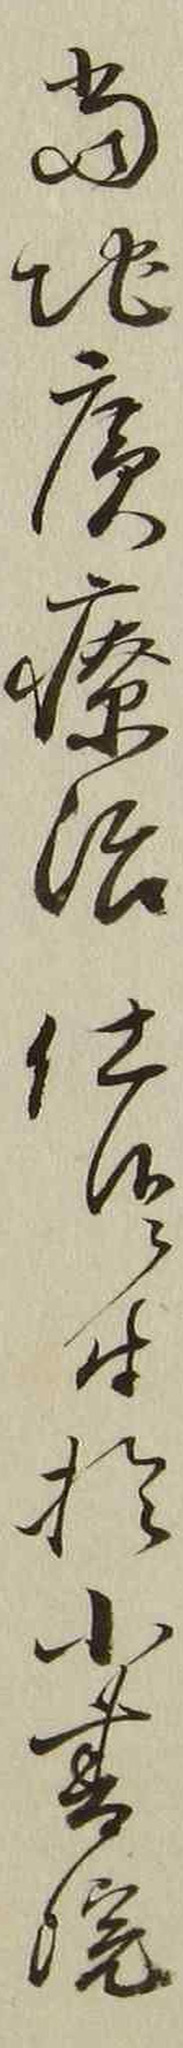当地広療治仕候ニ付於小書院
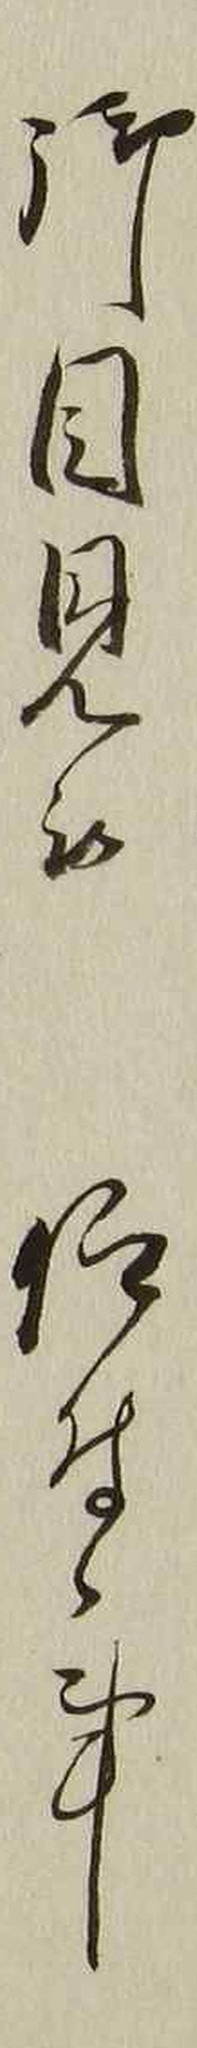御目見被仰付候事
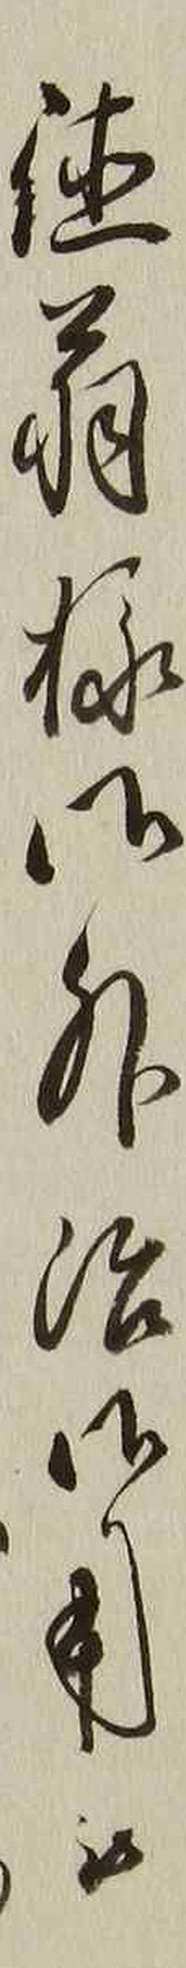徳翁様御外治御用被
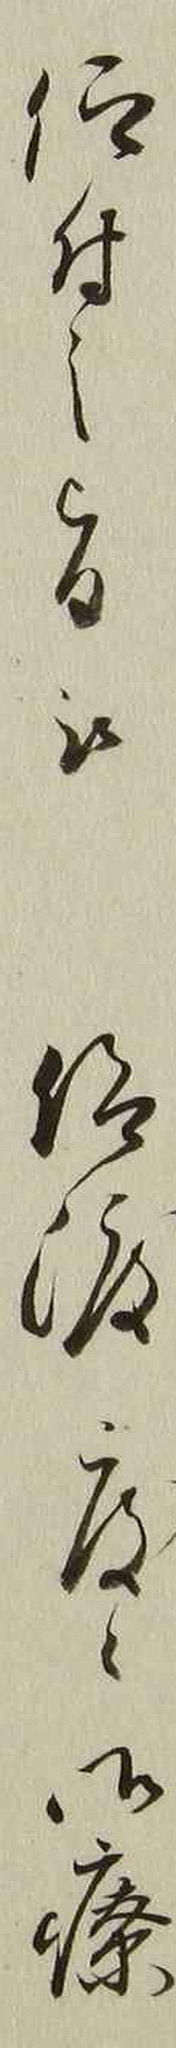仰付之旨被仰渡度々御療
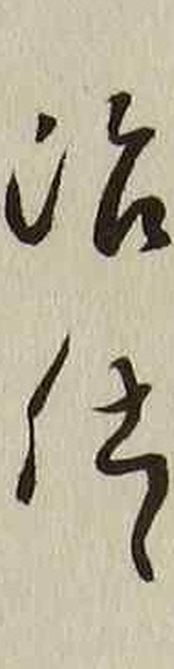治仕候
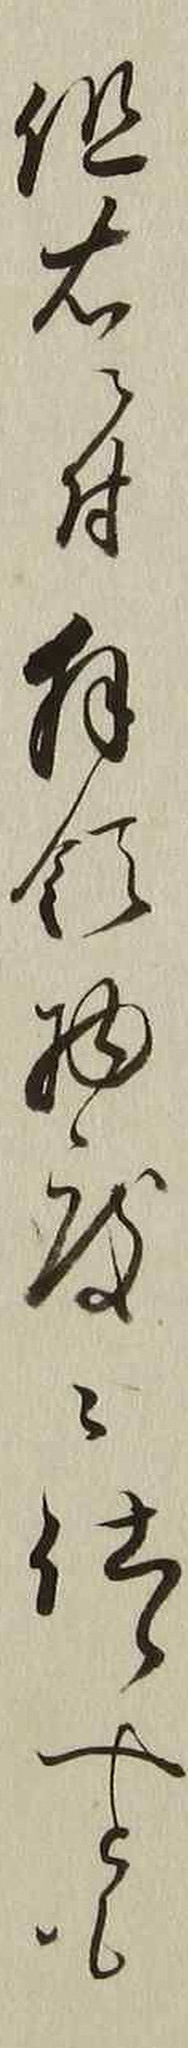但右ニ付拝領物度々仕候へとも
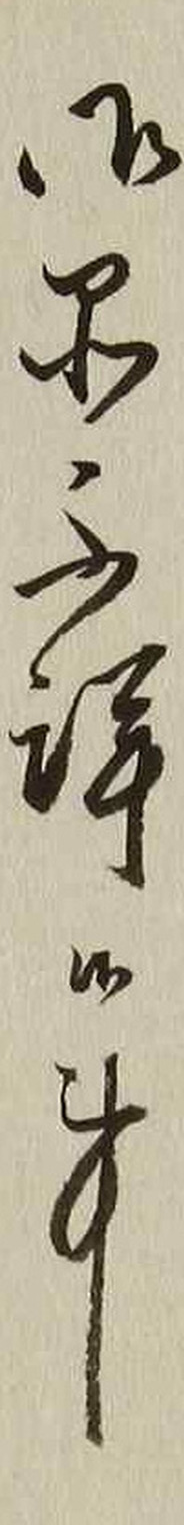御品不詳候事
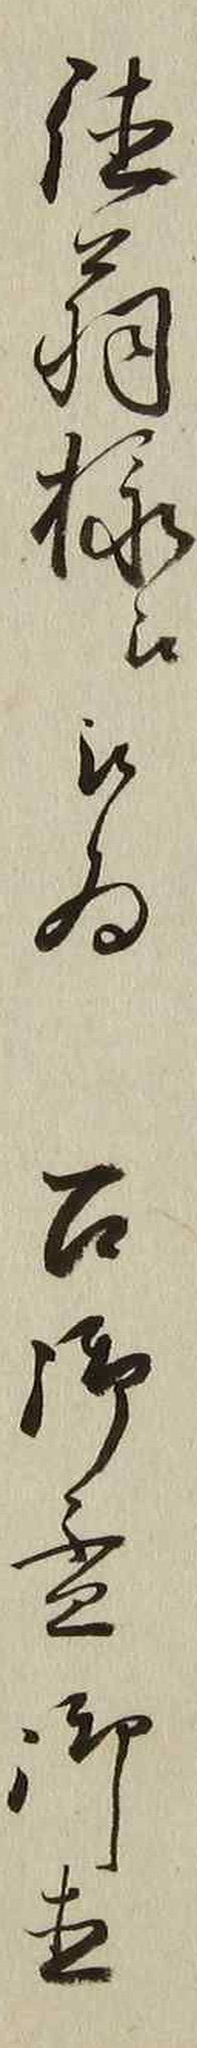徳翁様江被為召御盃御直
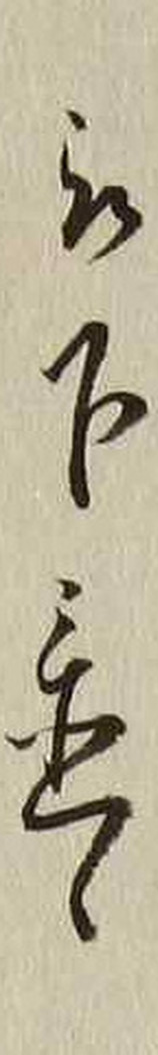被下置候
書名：諸士系譜　巻之52　に之部3
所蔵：会津若松市立会津図書館
